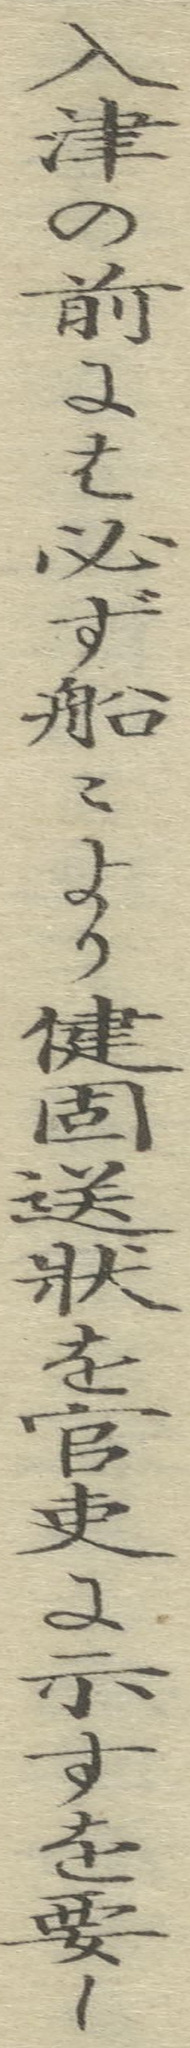入津の前には必ず船々より健固送状を官吏に示すを要し
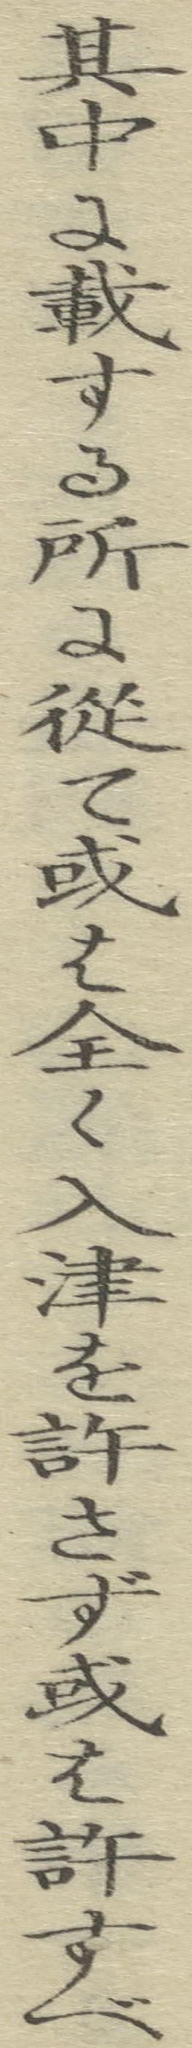其中に載する所に従て或は全く入津を許さず或は許すべ
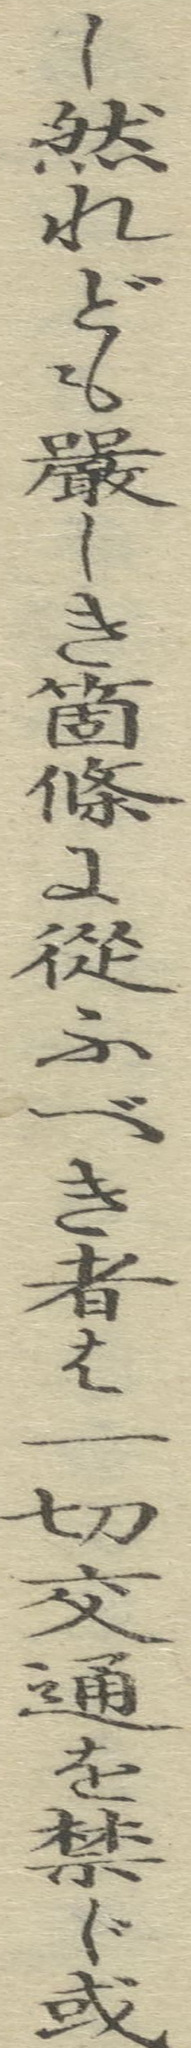し然れども厳しき箇条に従ふべき者は一切交通を禁じ或
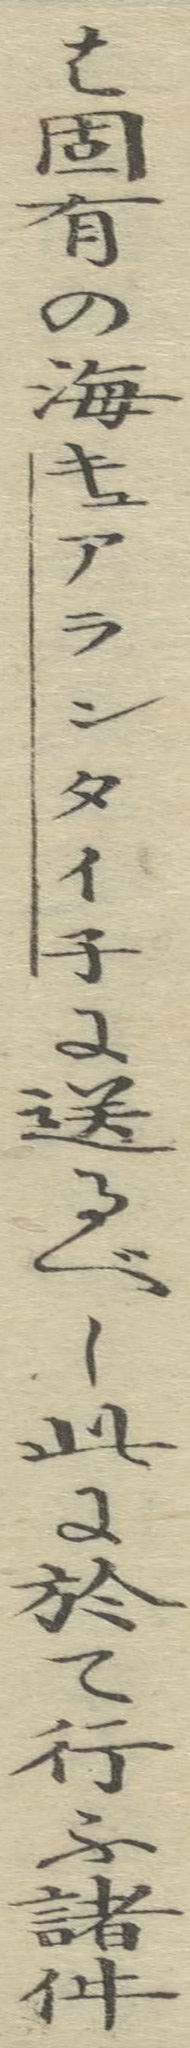は固有の海キュアランタイネに送るべし此に於て行ふ諸件
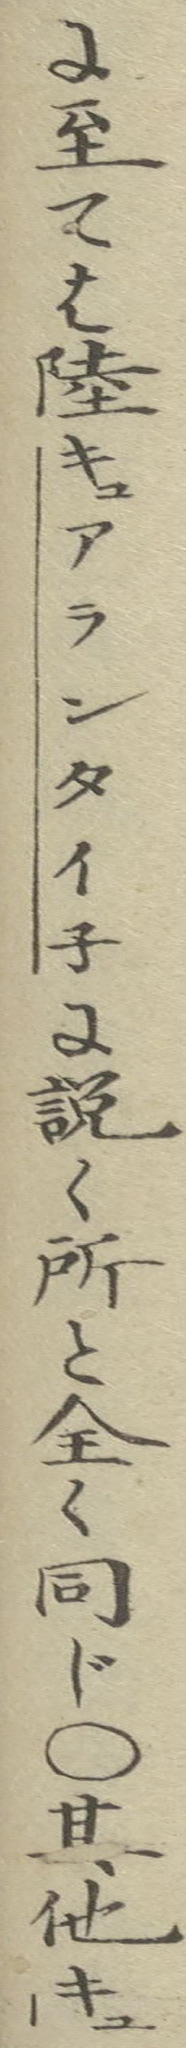に至ては陸キュアランタイネに説く所と全く同じ〇其他キュ
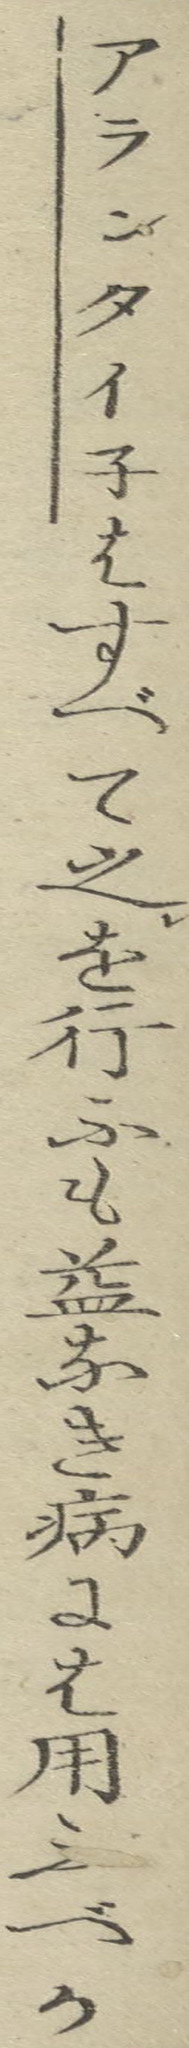アランタイネはすべて之行ふも益なき病には用ふべか
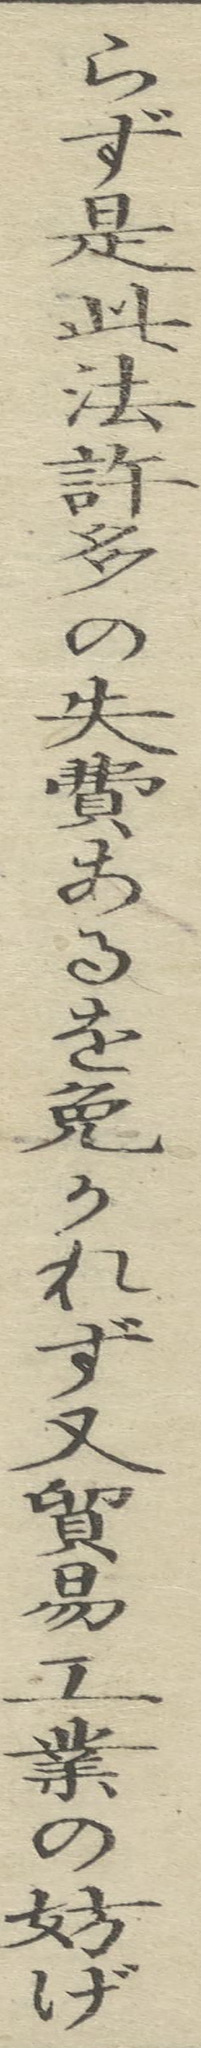らず是此法許多の失費あるを免かれず又貿易工業の妨げ
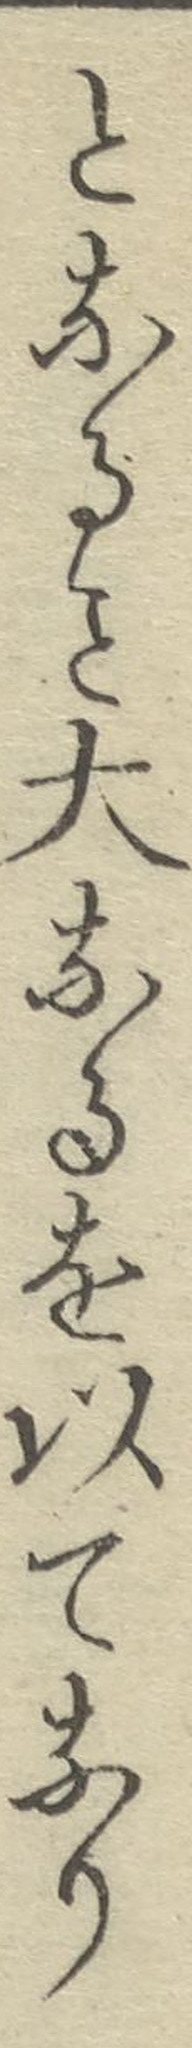となること大なるを以てなり
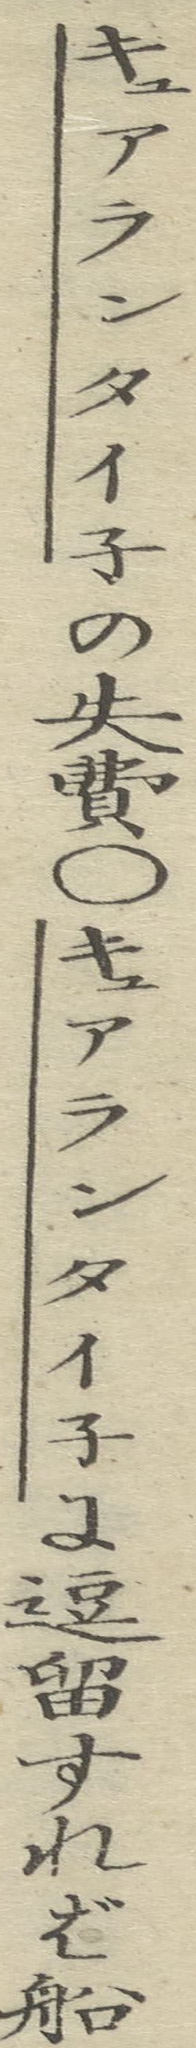キュアランタイネの失費〇キュアランタイネに逗留すれば船
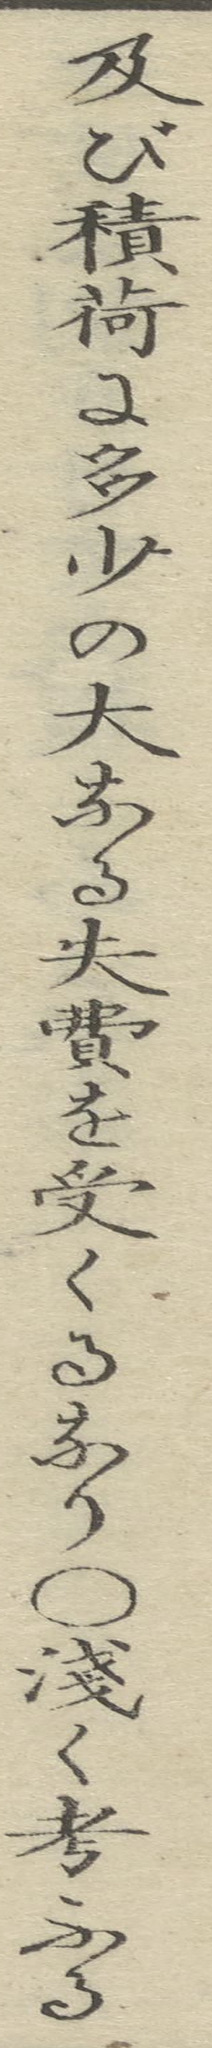及び積荷に多少の大なる失費を受くるなり〇淺く考ふる
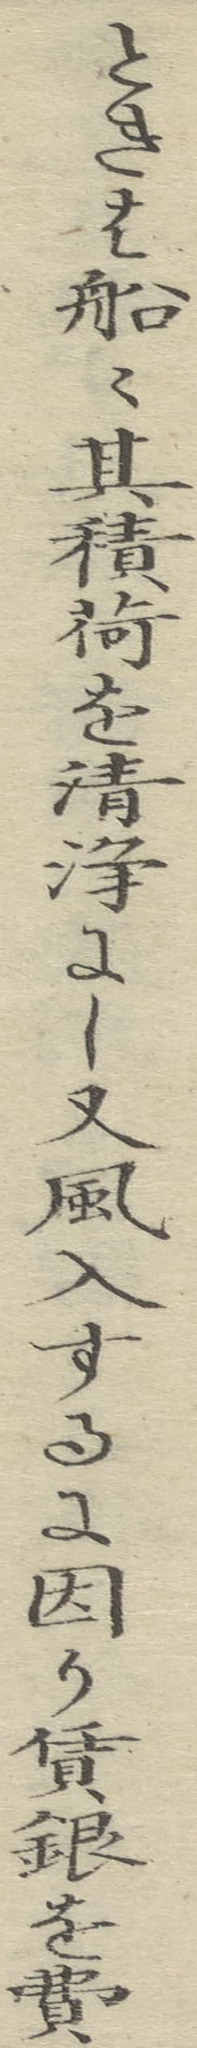ときは船々其積荷を清浄にし又風入するに因り賃銀を費
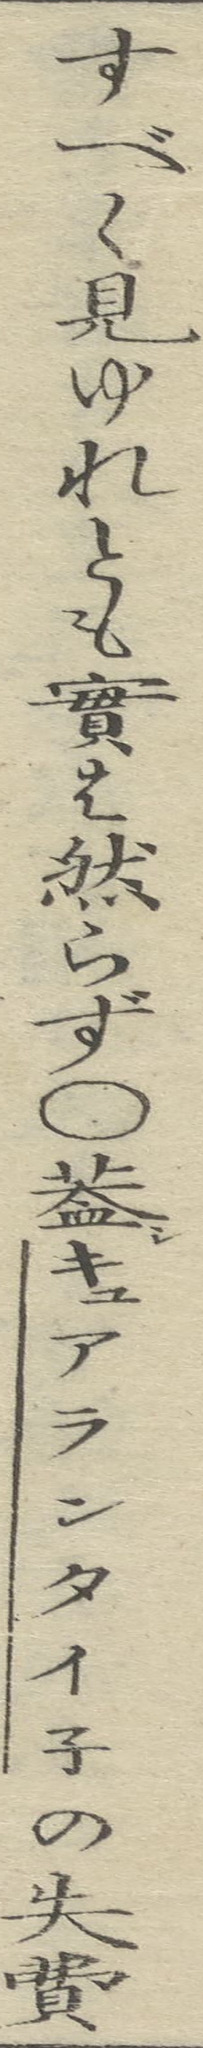すべく見ゆれとも實は然らず〇葢キュアランタイネの失費
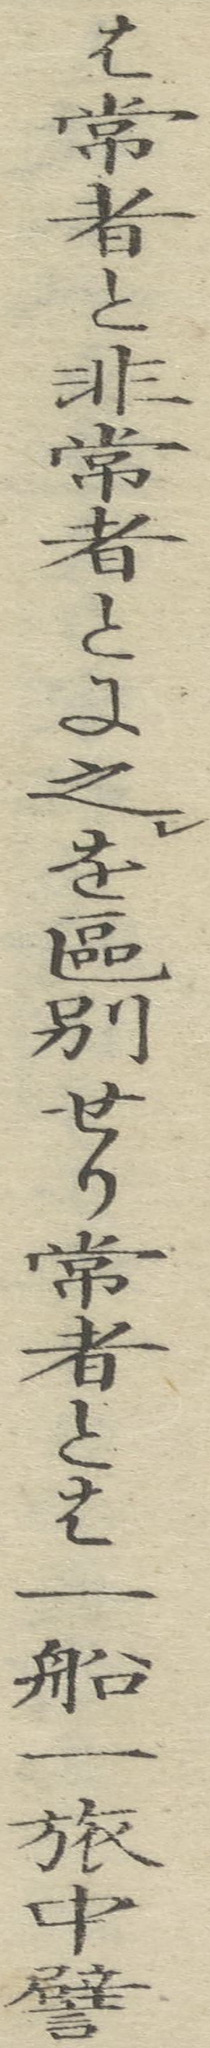は常者と非常者とに之區別せり常者とは一船一旅中譬
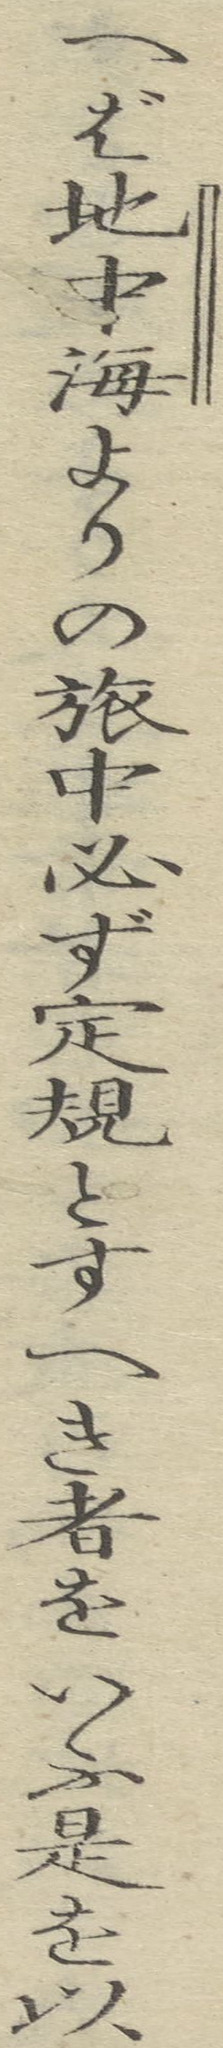へば地中海よりの旅中必ず定規としへき者をいふ是を以
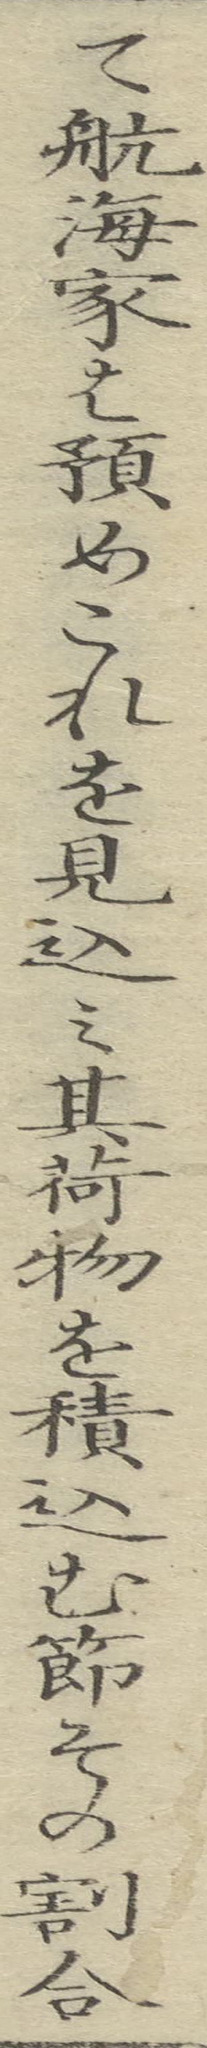て航海家は預めこれを見込み其荷物を積込む節その割合

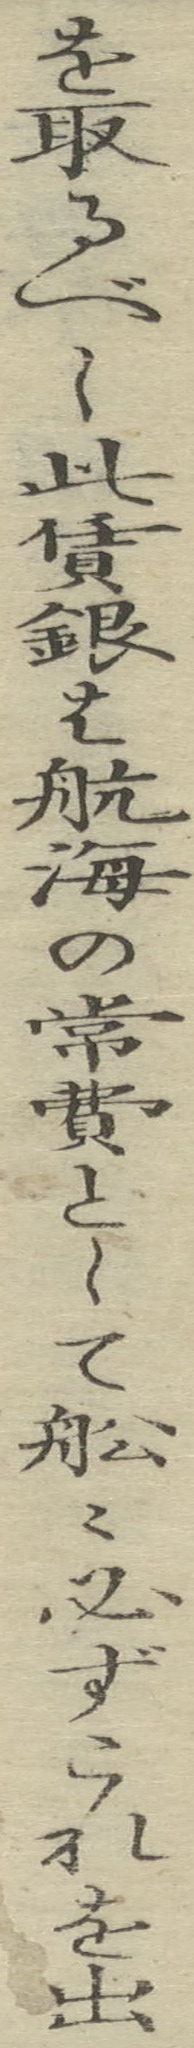を取るべし此時賃銀は航海の常費として舩々必ずこれを出
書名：官版疫毒預防説　全
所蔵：東京大学総合図書館 General Library in the University of Tokyo, JAPAN
